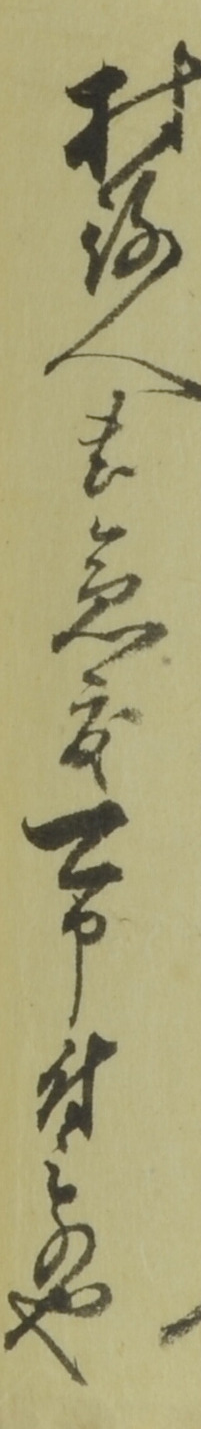村役人共急度可申付もの也

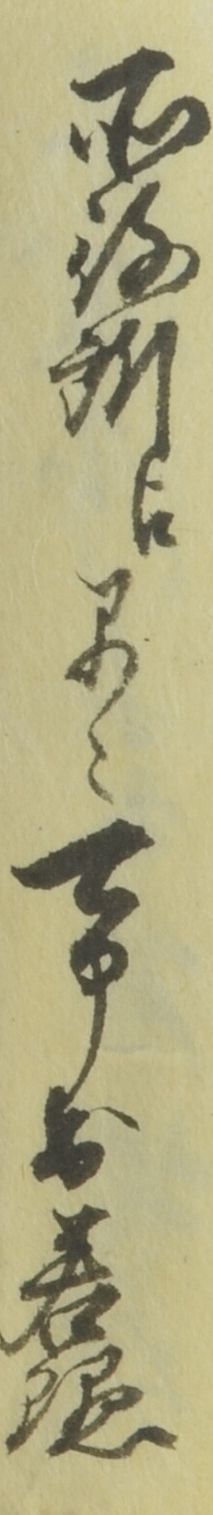所役所江草々可申出若隠
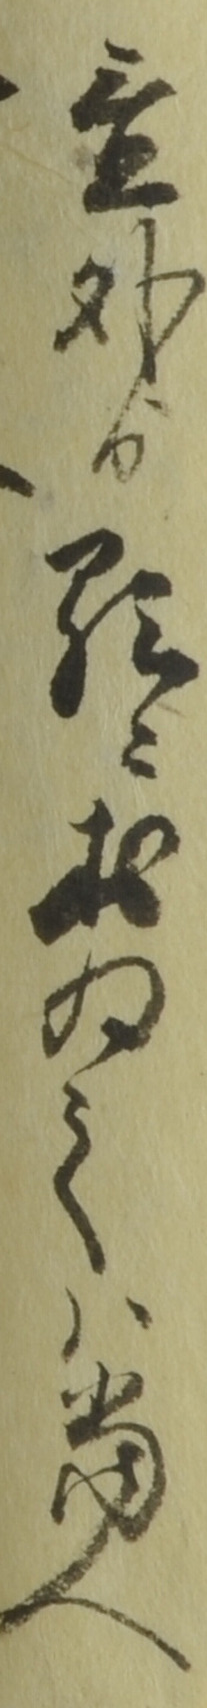置外ゟ顕ニおゐてハ当人
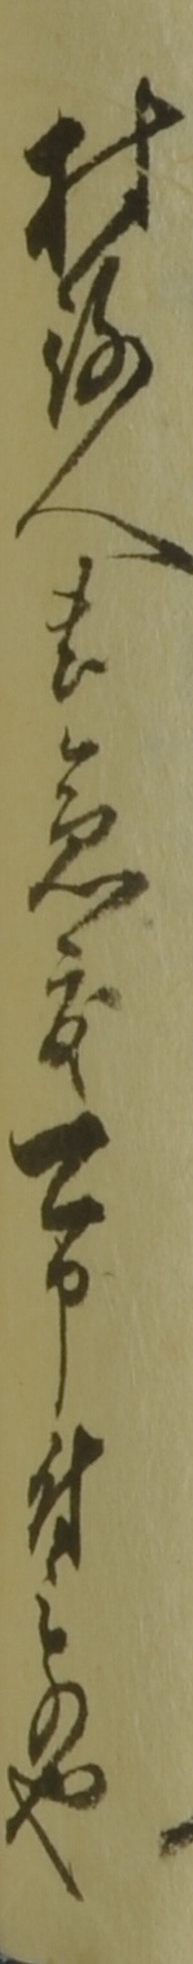村役人共急度可申付もの也
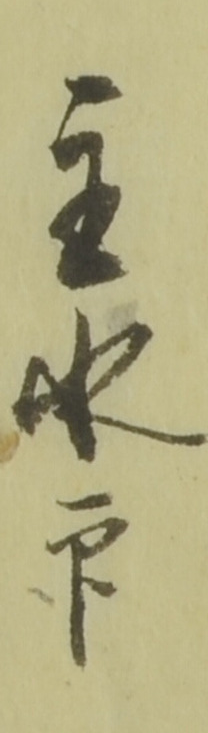主水印
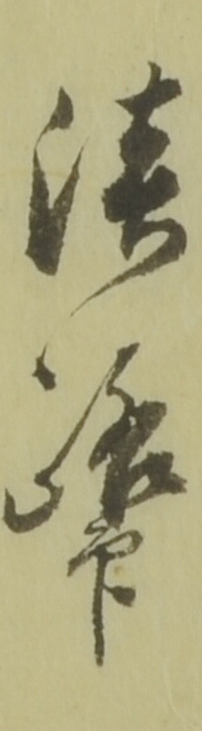淡路印
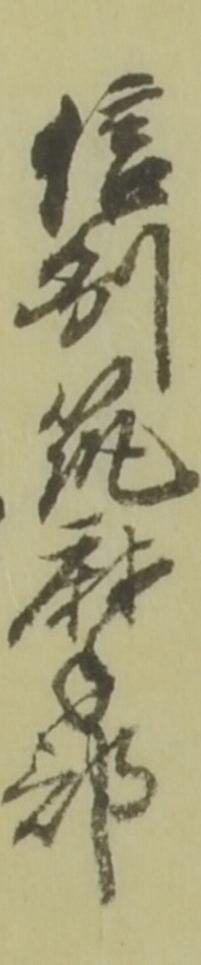信州筑摩郡
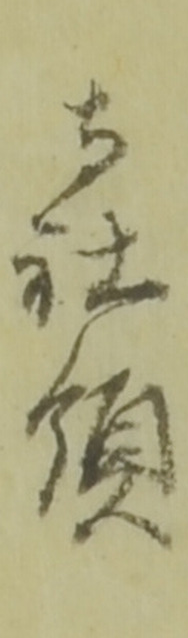寺社領
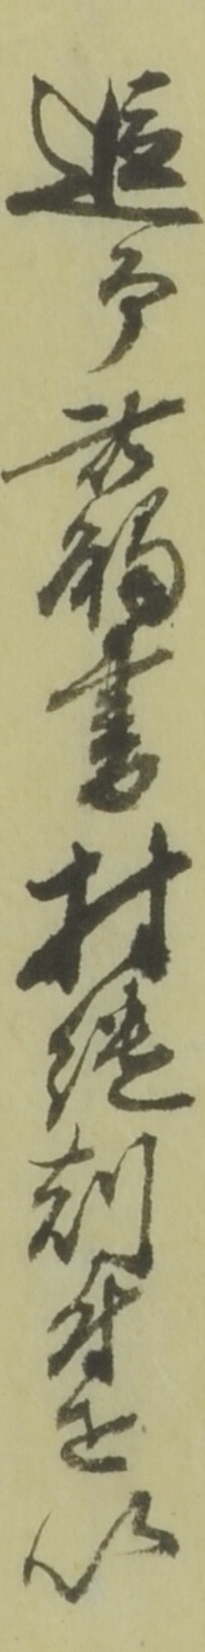追而此触書村継刻付を以
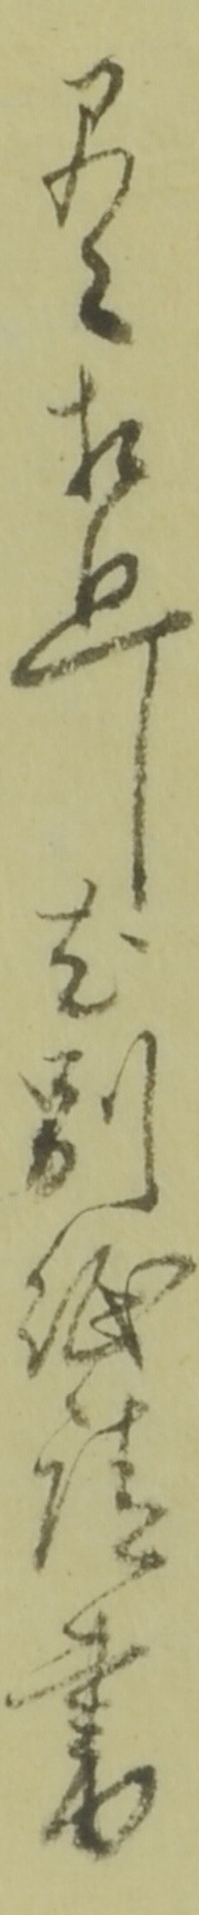早々相廻し尤別紙請書
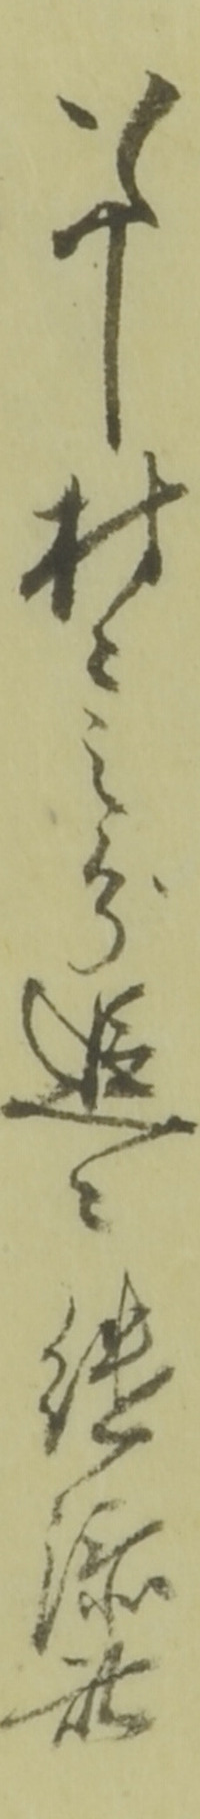いたし村々之分追々継添此
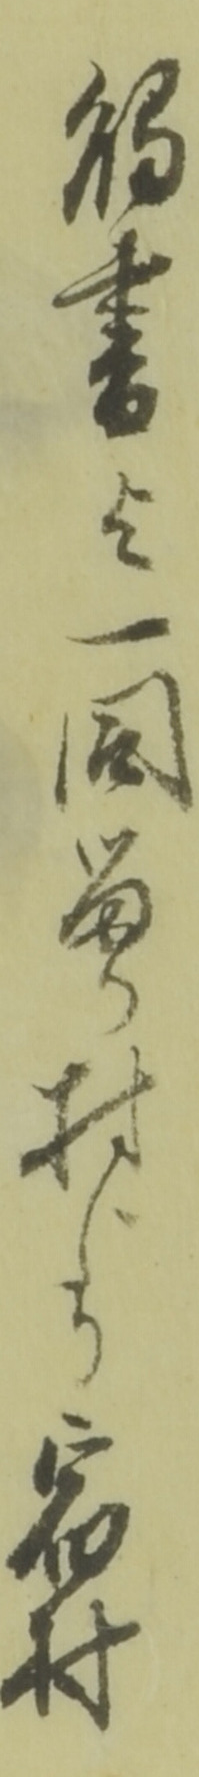触書と一同当り村より宿村
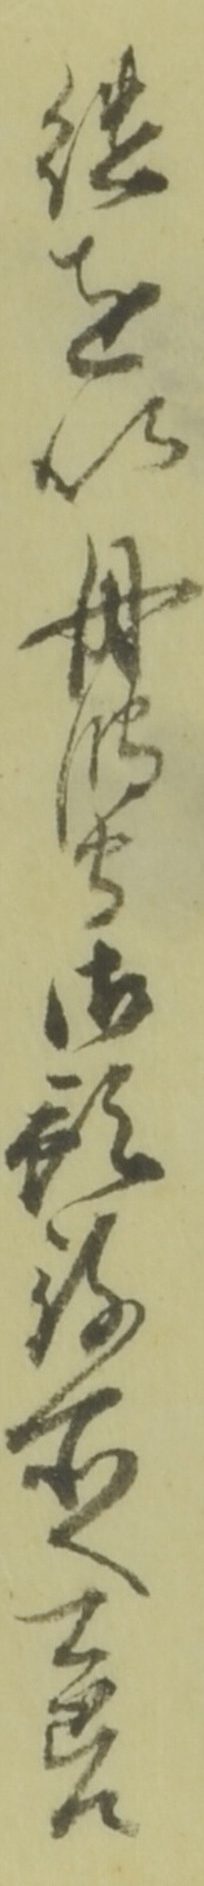継を以丹波守御預役所へ可差
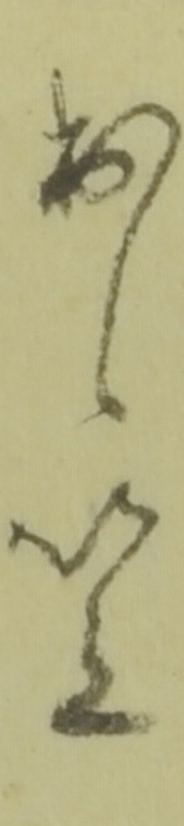出候以上

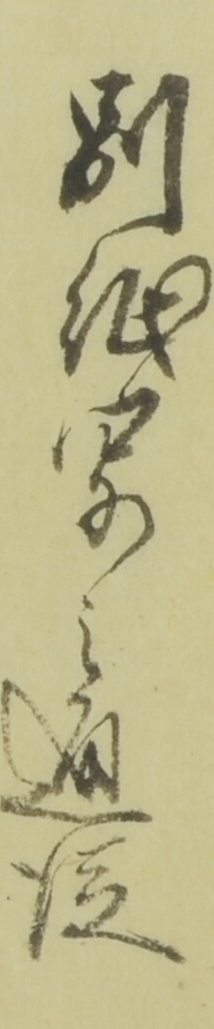別紙写之通従
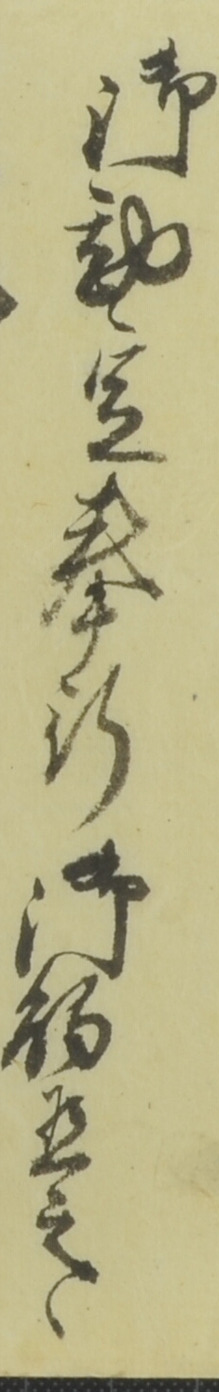御勘定奉行御触有之候
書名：御触書御書附控
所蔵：伊那市立高遠町図書館・合同会社AMANE
